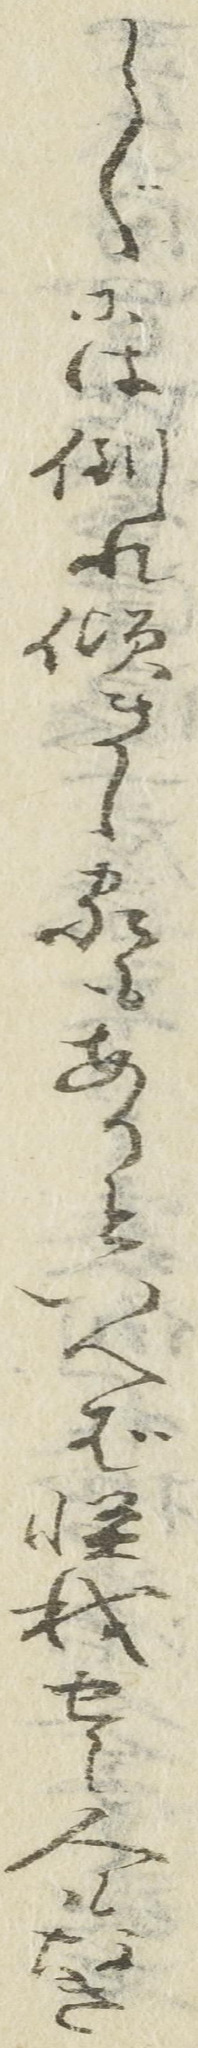し〴〵には倒れ傾きし家もありといへば怪我セし人もなき
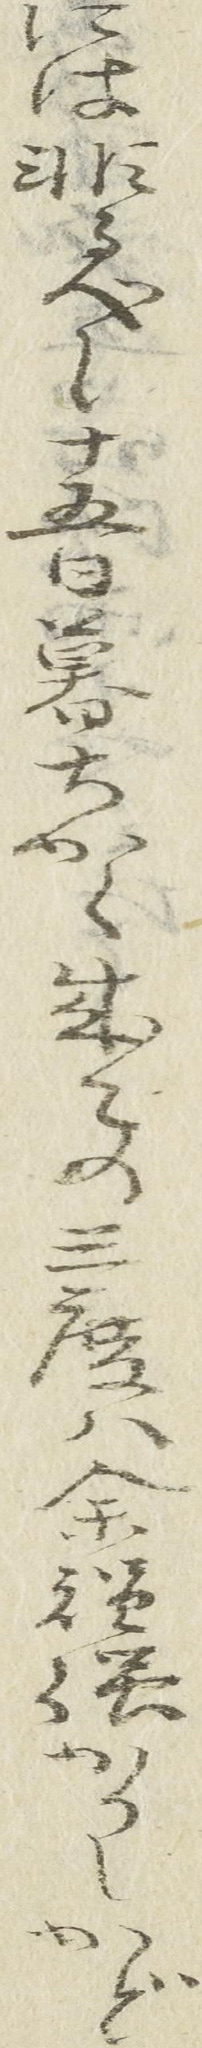には非るべし十五日暮ちかく成ての三度ハ余程強かりしかど
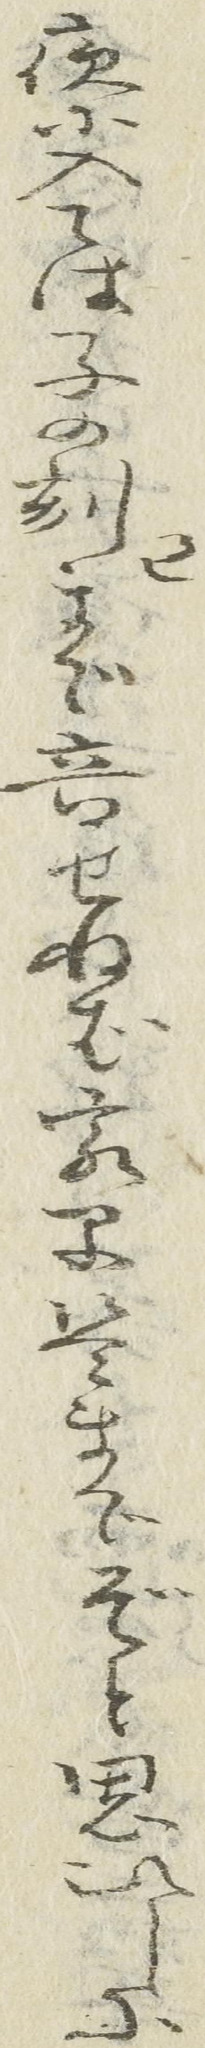夜に入ては子の刻まで音せねば最早是までぞと思ひしに
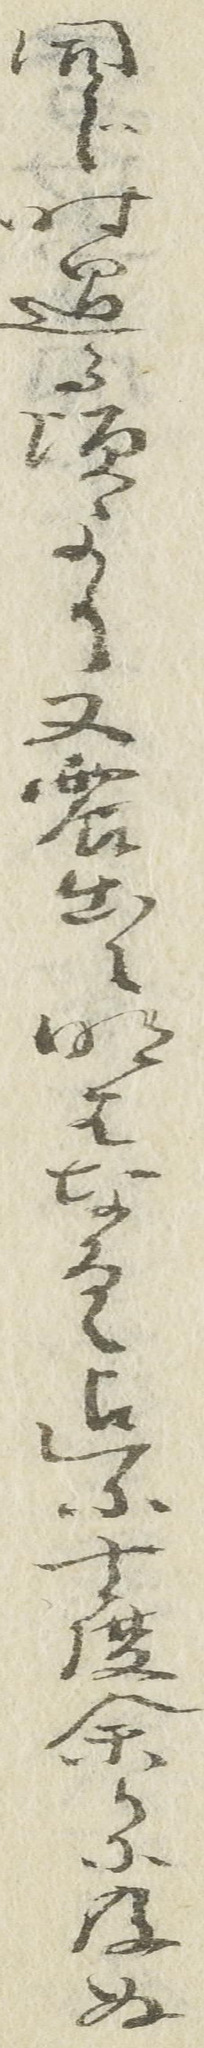同じ時過る頃より又震出て明はなるゝ迄に十度余りに及ぬ
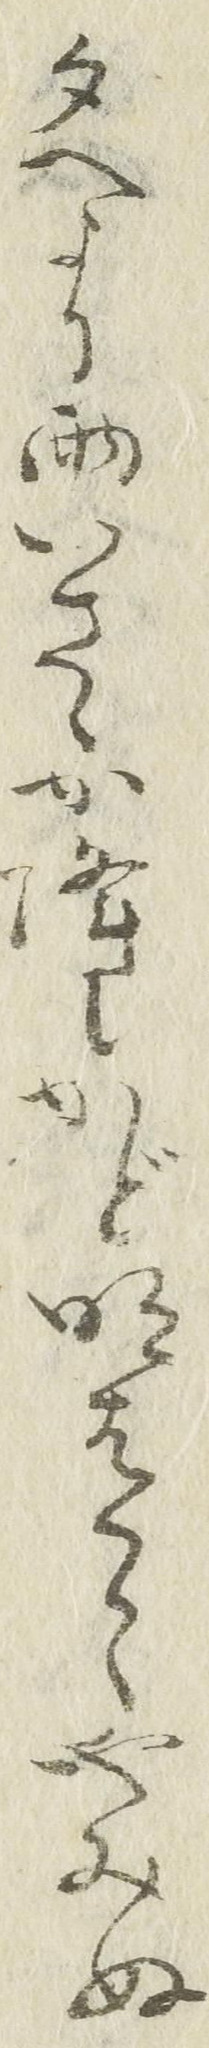夕へより雨いさゝか降しかど明はてゝやみぬ
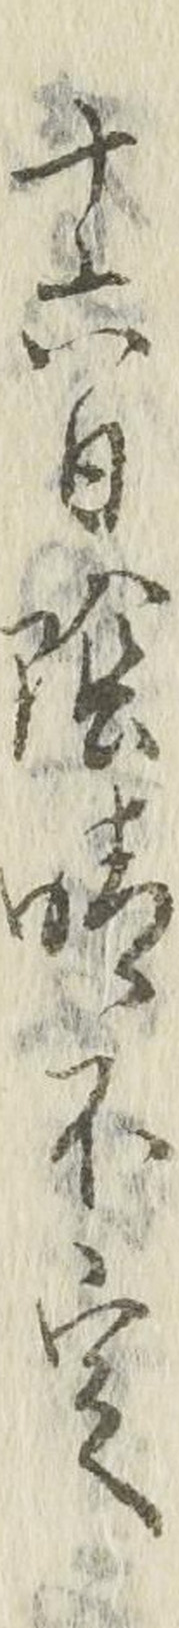十六日陰晴不定
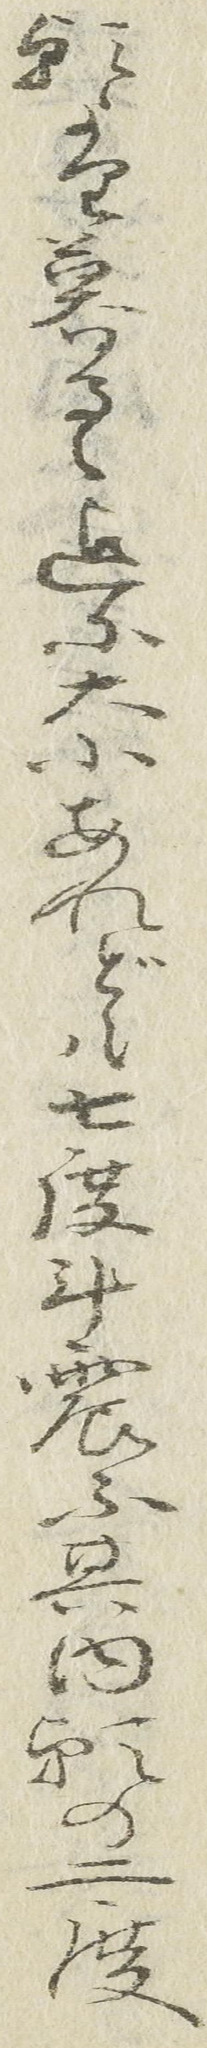朝より暮るゝ迄に大小あれども七度斗震ふ其内朝の二度
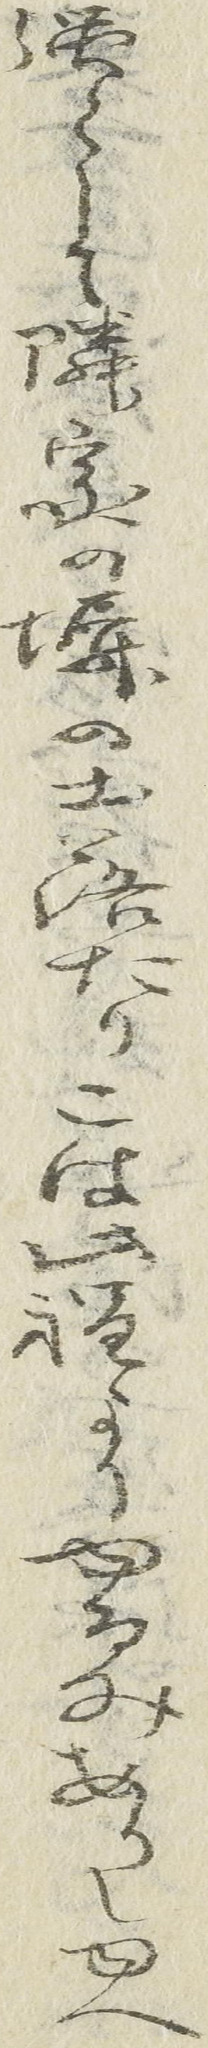強くして隣家の塀の土落たりこは此程よりゆるみありしゆへ
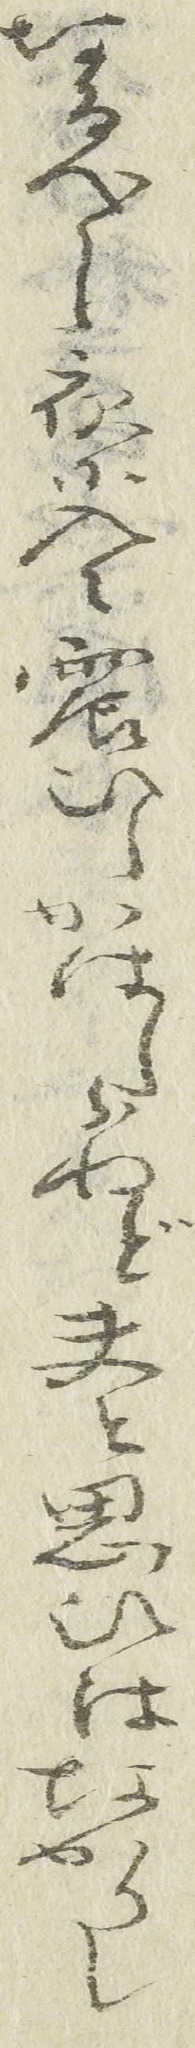なるべし夜に入て震ひしかはしらねど夫と思ひはなかりし
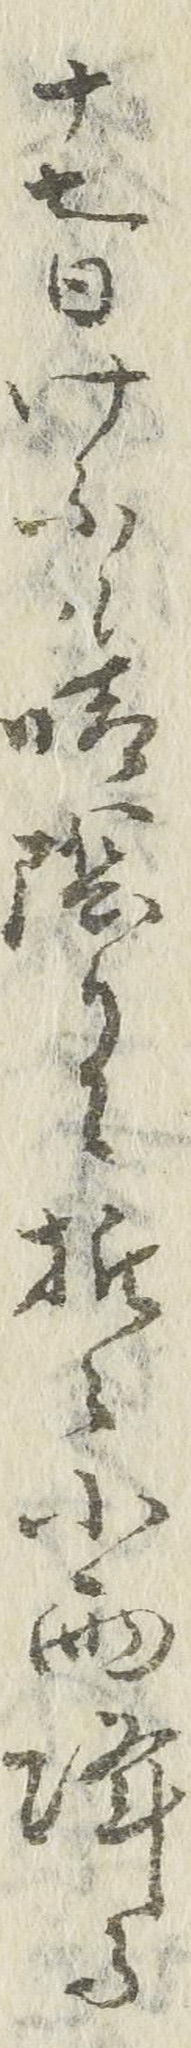十七日けふも晴陰りて折々小雨降る
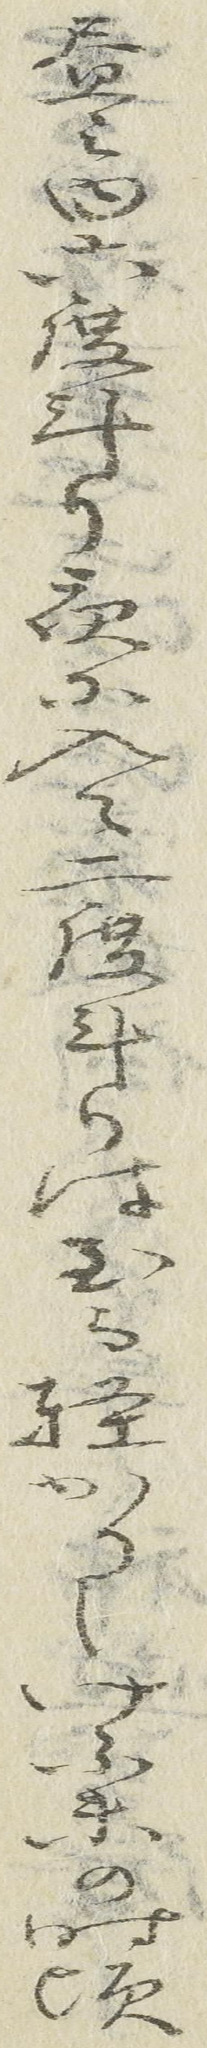昼之内六度斗り夜に入て二度斗りは至而軽かりしけふ未の時頃
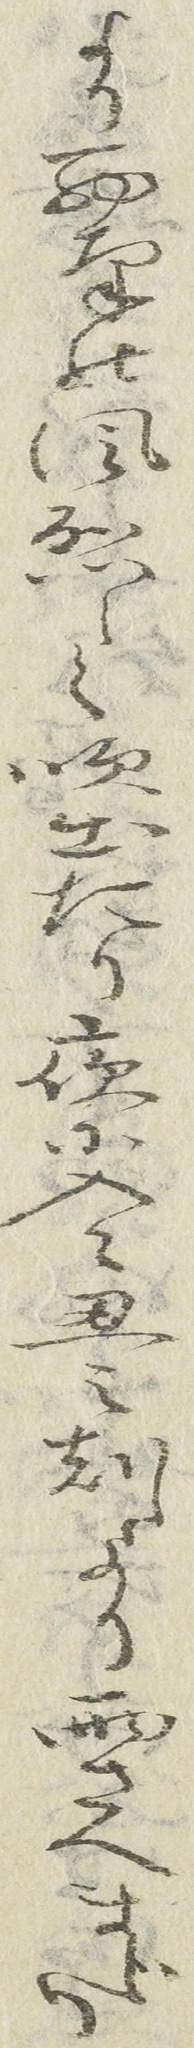より西南の風烈しく吹出たり夜に入て丑之刻より雨さへまじり

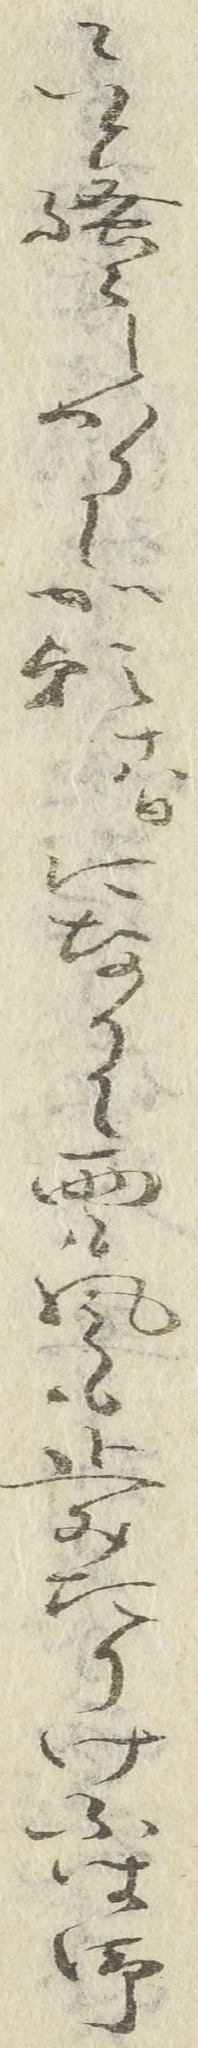ていと騒々しかりしが朝十八日になりて雨も風も止みたりけふは御
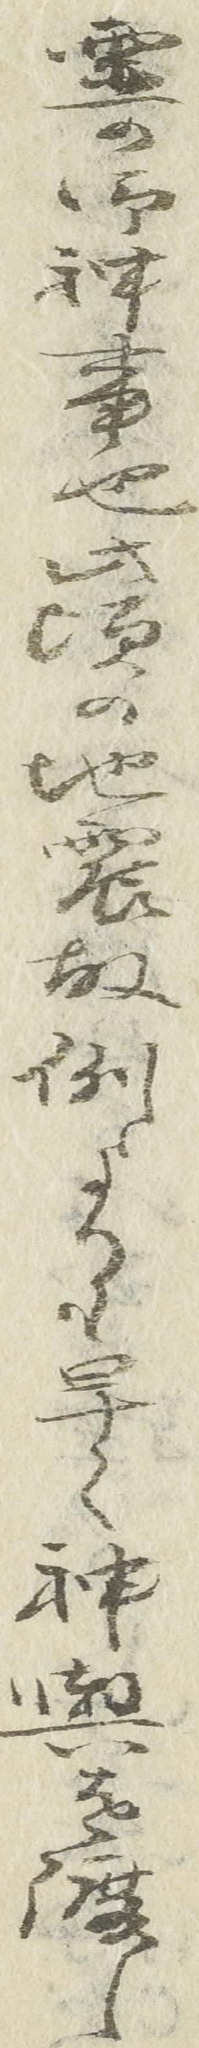霊の御神事也此頃の地震故例よりも早く神輿を渡し
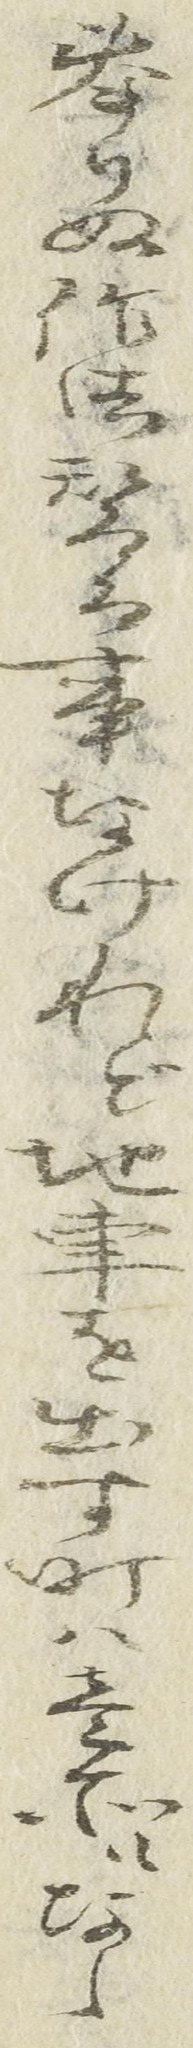参りぬ作法替る事なけれど地車を出す町ハ壱所もなし
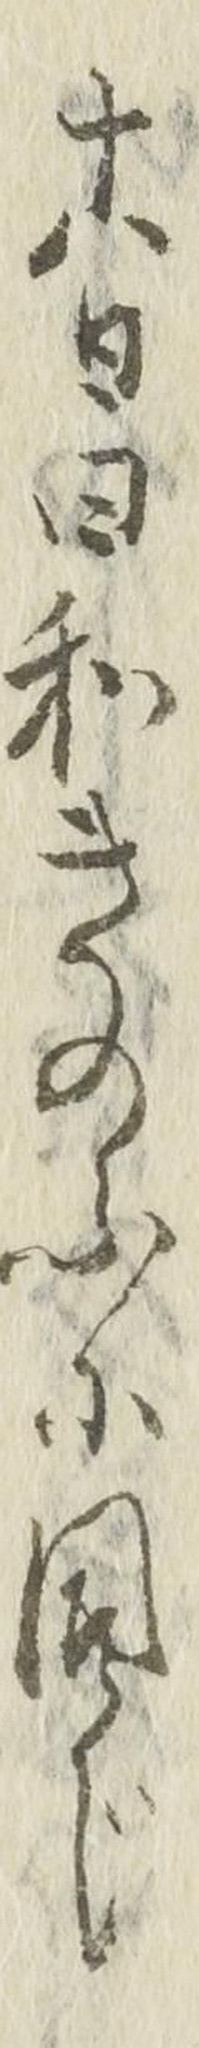十八日日和きのふに同じ
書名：地震前兆集　全
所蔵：東京大学地震研究所図書室 Earthquake Research Institute Library, The University of Tokyo, JAPAN
